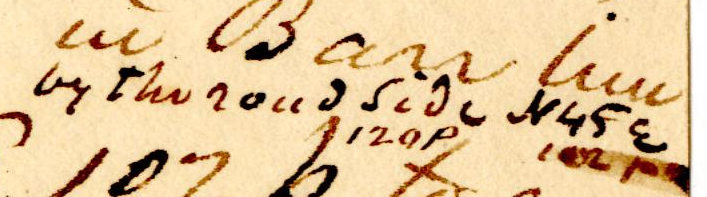by the road side N45E
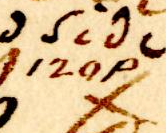120 P
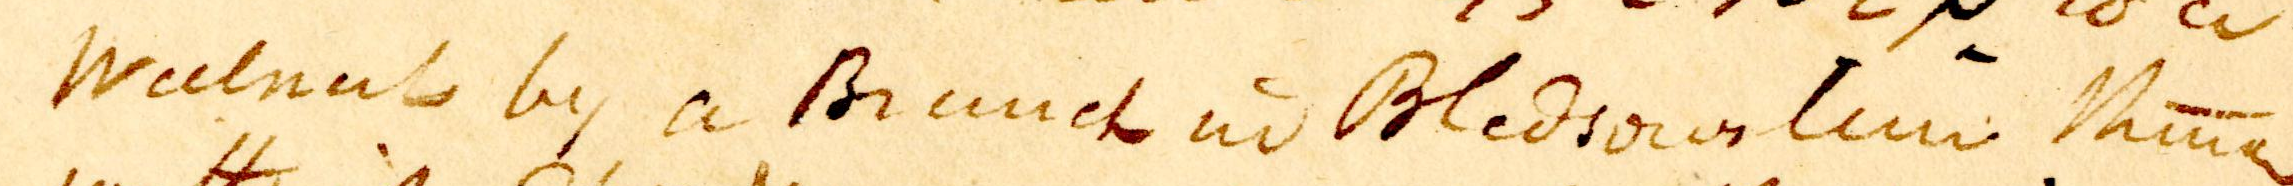walnuts by a Branch in Bledsoes line thence
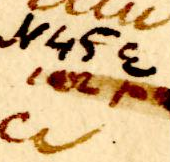102 P
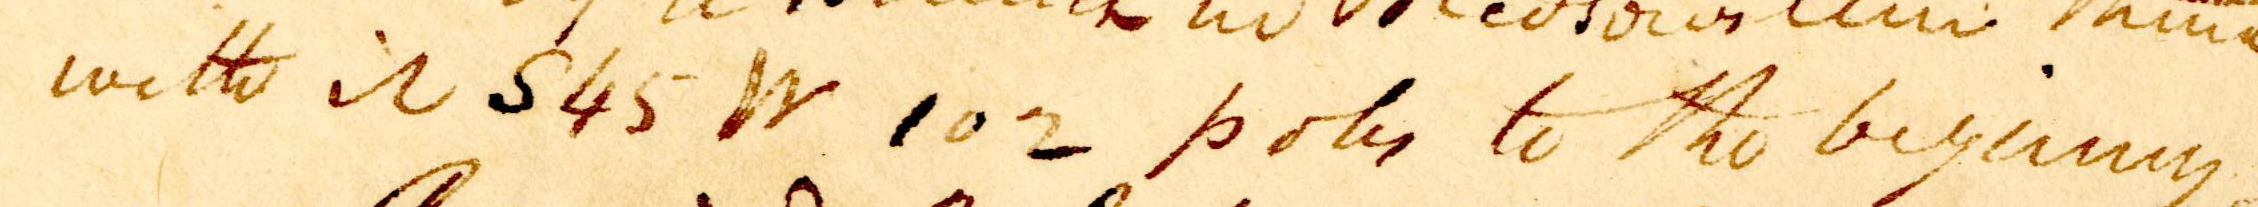with is S45 W 102 poles to the beginning
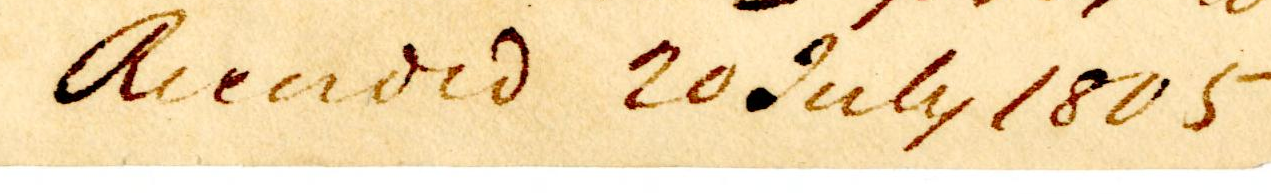Received 20 July 1805
